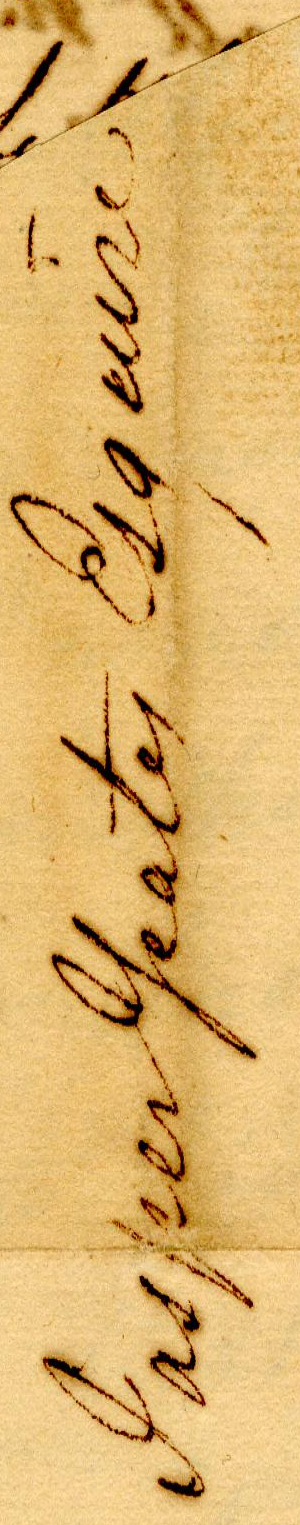Jasper Yeates Esquire
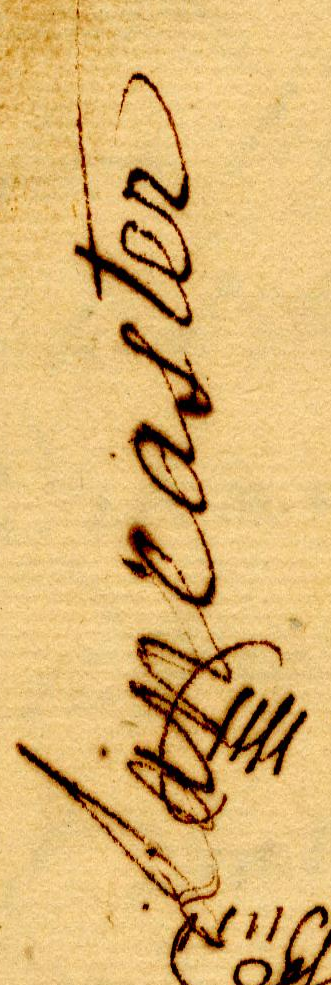Lancaster
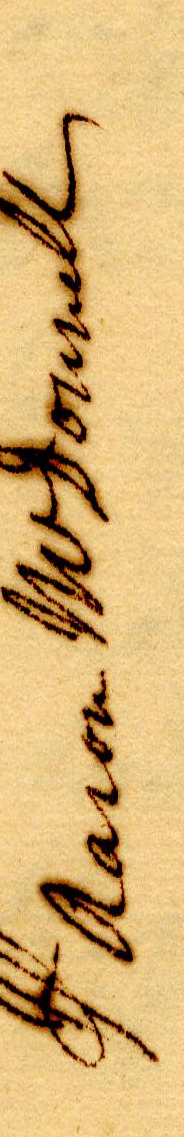Per Aaron McDonnell
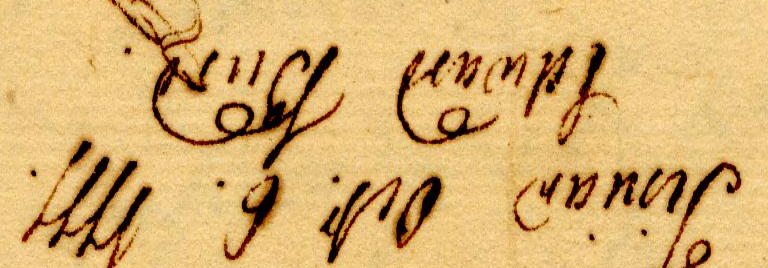Tinian Oct^r. 6. 1777.
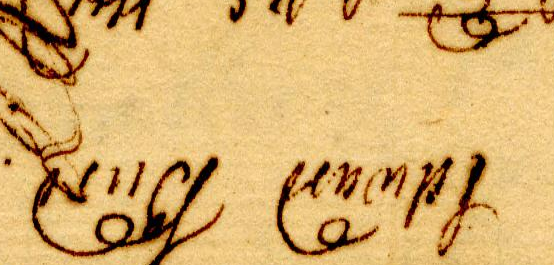Edward Burd.
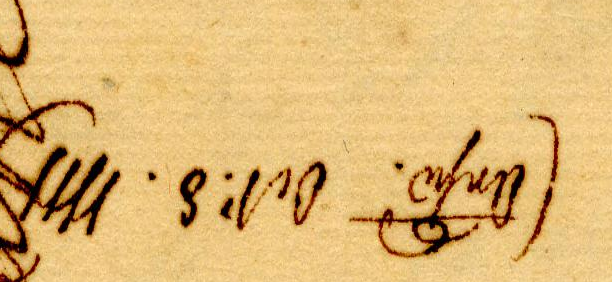(Answ^d. Oct. 8. 1777)
